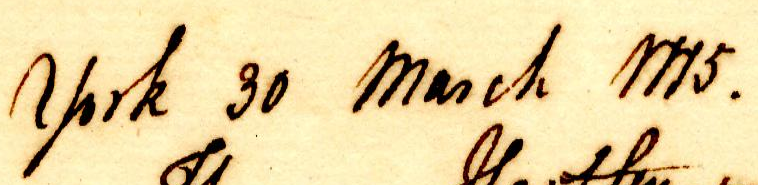York 30 March 1775
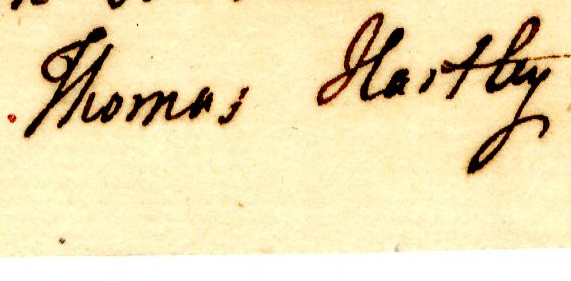Thomas Hartley
